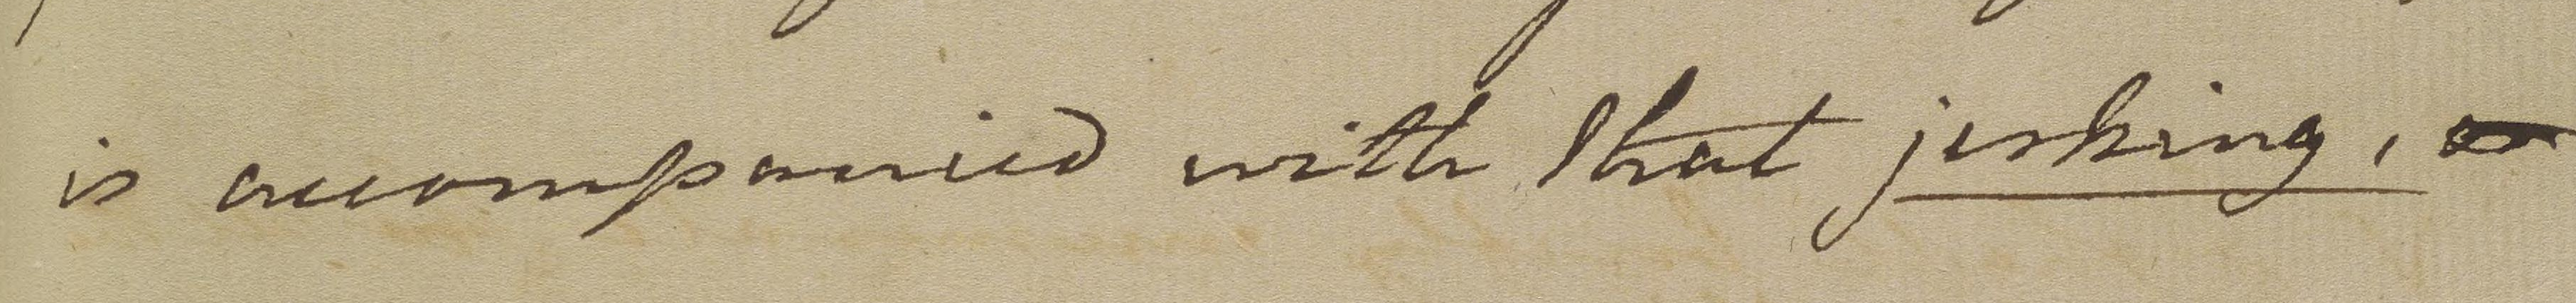is accompanied with that jerking, [or]
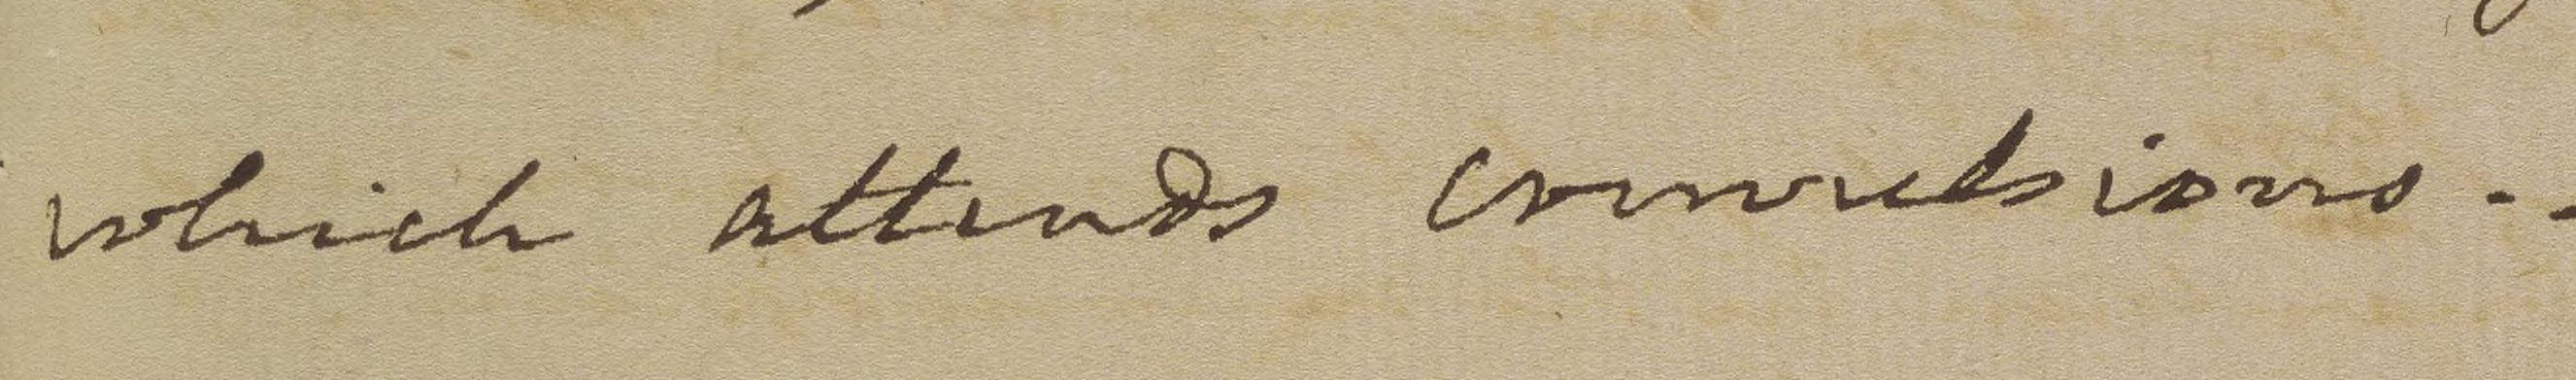which attends convulsions.
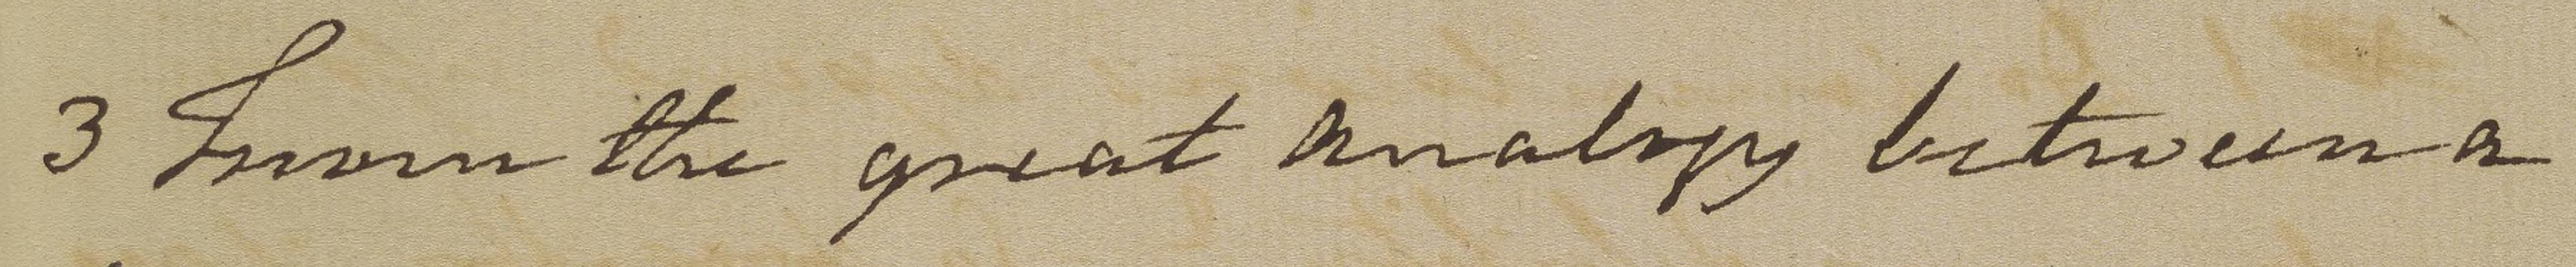3 From the great analogy between a
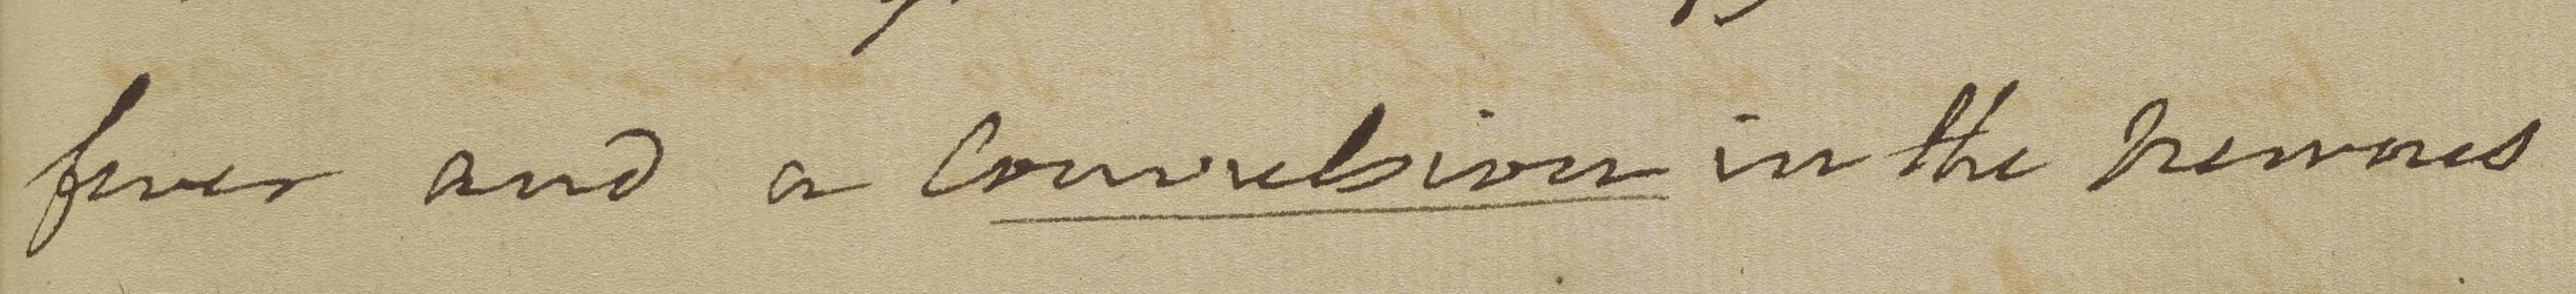fever and a convulsion in the nervous
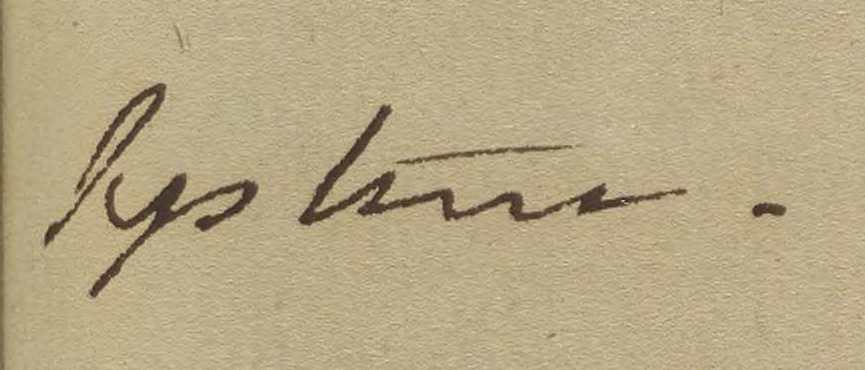system.
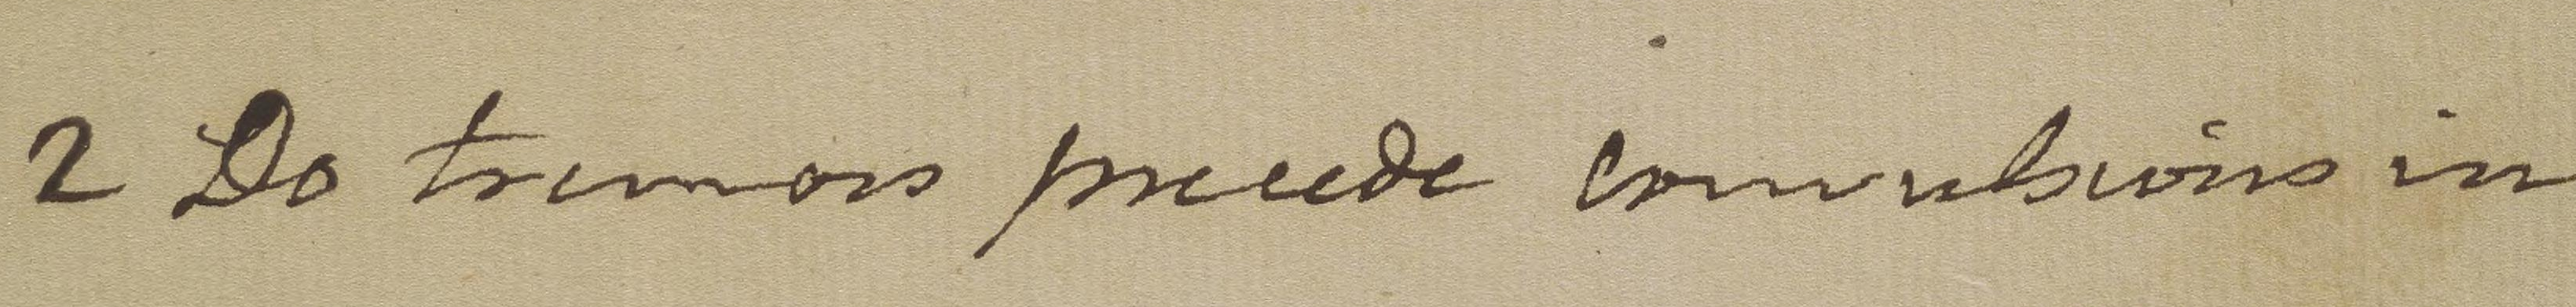2 Do tremors precede convulsions in
